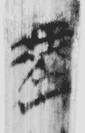𫊟
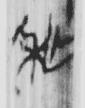{禾亡}
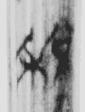稅
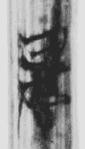是
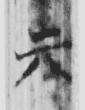亓
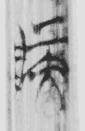疾
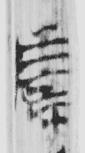{石主}
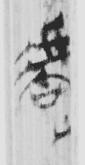唬
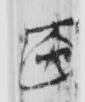医
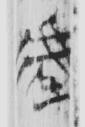𫊟
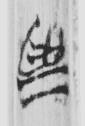爲
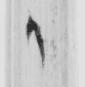人
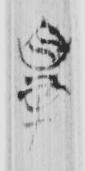辠
